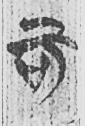可
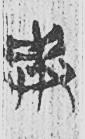奉
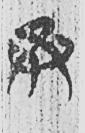承
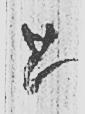也
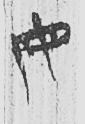母
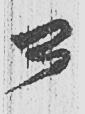乃
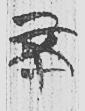不
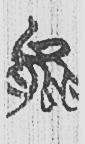能
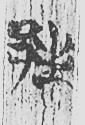邦
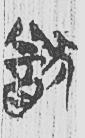猶
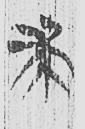求
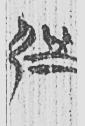{弓口二}
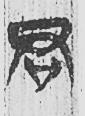君
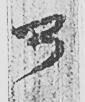乃
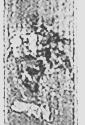命
